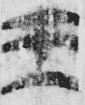王
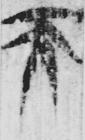天
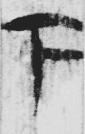下
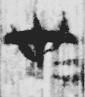三十
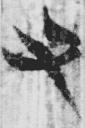又
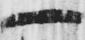一
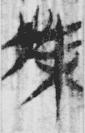○（世）
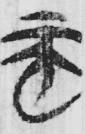而
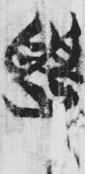受（紂）
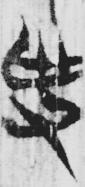拃（作）
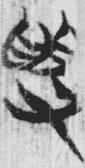受（紂）
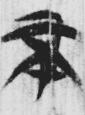不
